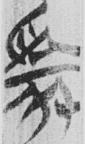○（家）
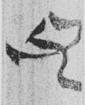父
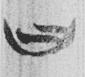曰
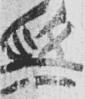爲
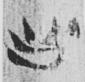此
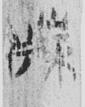殜（世）
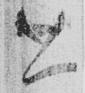也
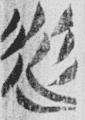從
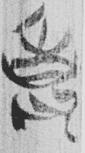事
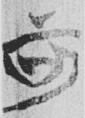可（何）
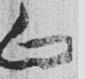㠯（以）
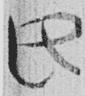女（如）
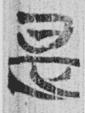是
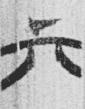亓（其）
